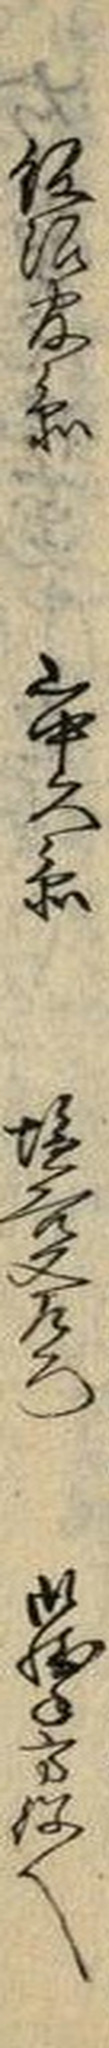飯沼官兵衛山中久兵衛塩谷又左衛門御勝手方役人
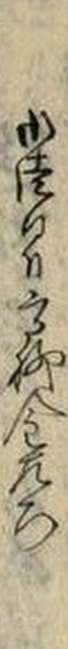御徒目付高柳金左衛門
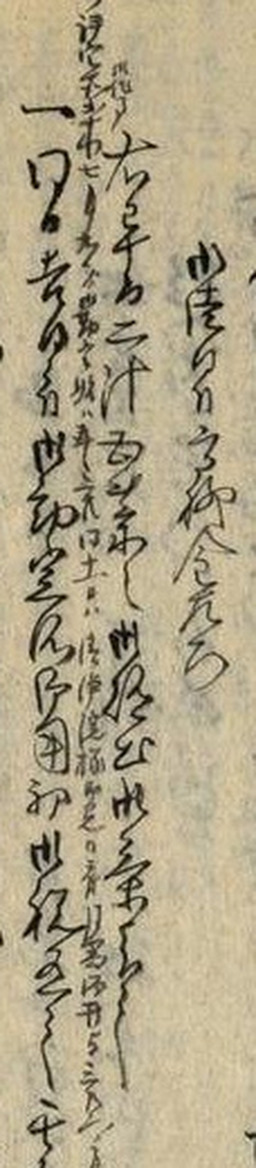右畢て二汁五菜之御賄出御茶被下之
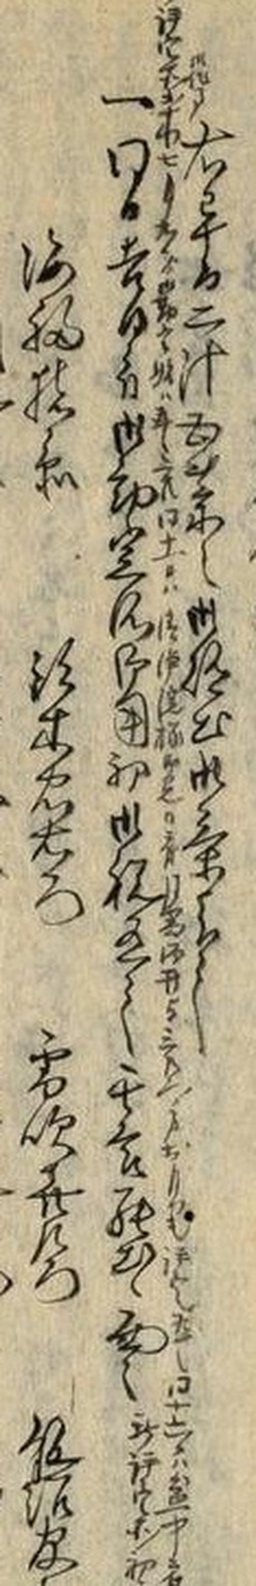一同日吉日に付御勘定所御用初御祝有之其節罷出候面々
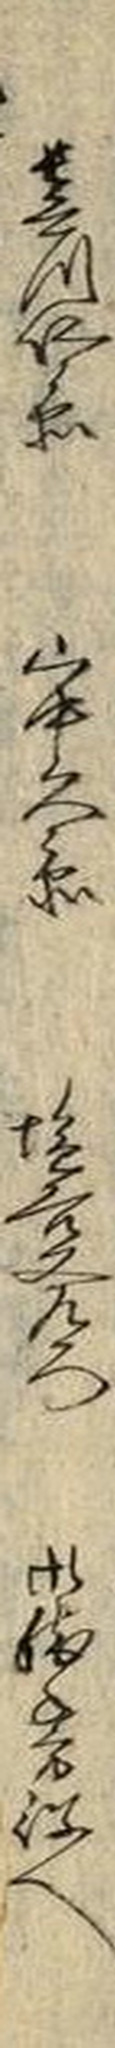長谷川仁兵衛山中久兵衛塩谷又左衛門御勝手方役人
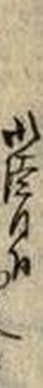御徒目付
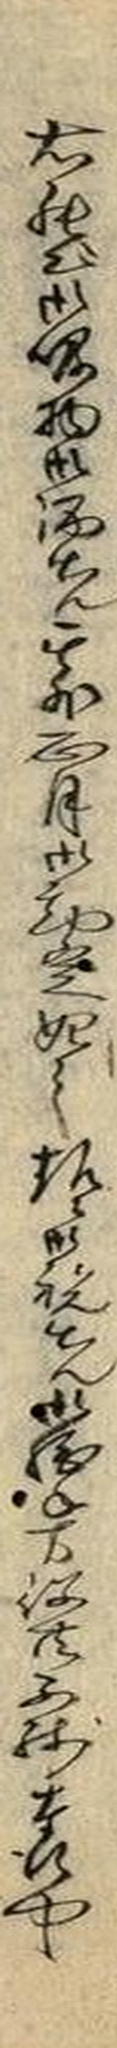右罷出御吸物御酒出ル其外正月御勘定始之趣に御祝出ル御勝手方役共不残奉行中
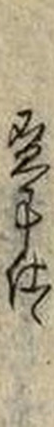盃事仕候
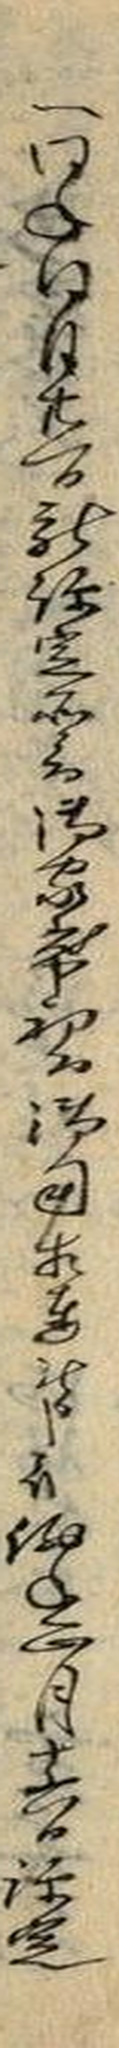一同年同月廿一日新評定所にて御家老中初て御用相達被申に付例年正月十六日評定
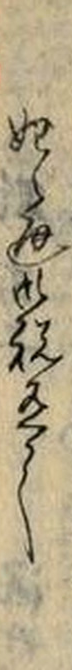始之通御祝有之

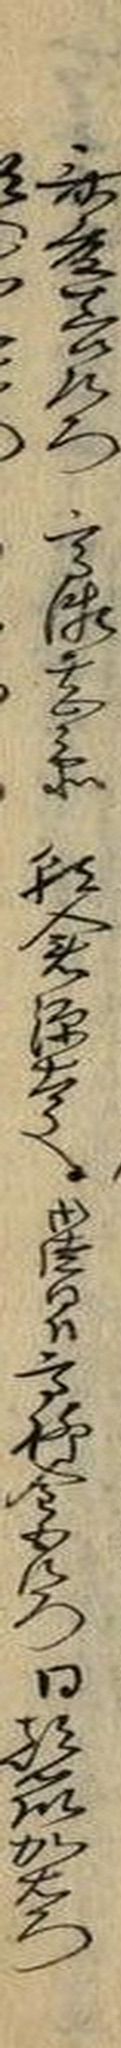齋藤善左衛門高瀬甚兵衛朝倉源太夫御徒目付高柳金五左衛同都筑加右衛門
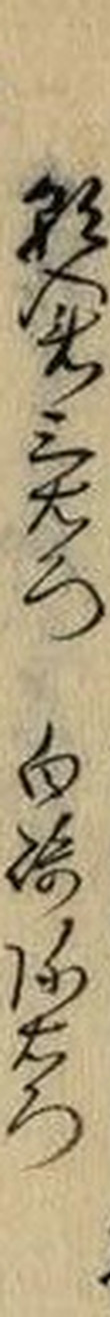朝倉三右衛門白崎弥右衛門
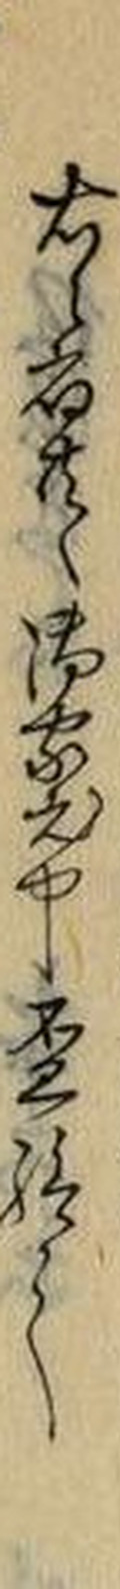右之者共へ御家老中盃給之
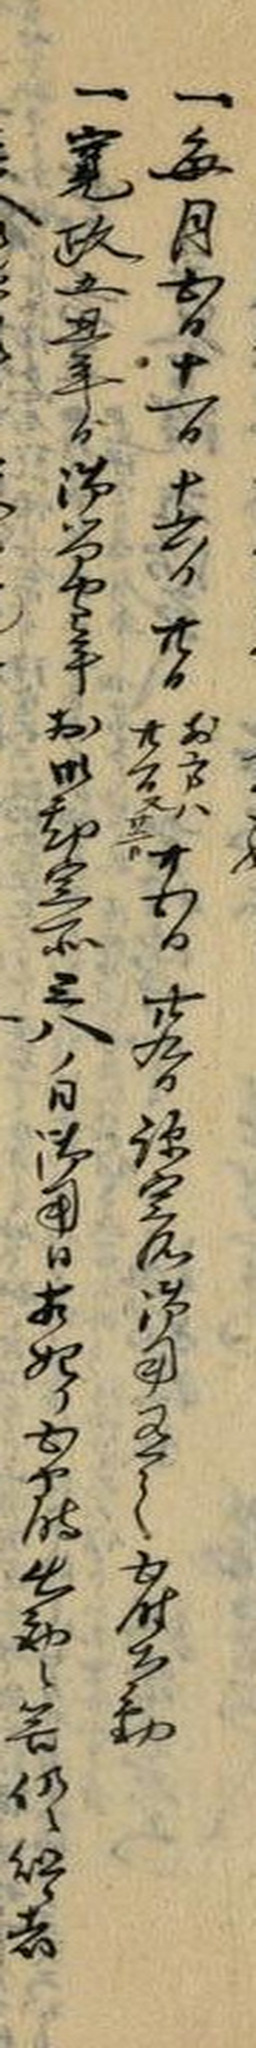一寛政五丑年ゟ御留守年於御勘定所三八ノ日御用日相始り五半時出勤之筈仍之組之者
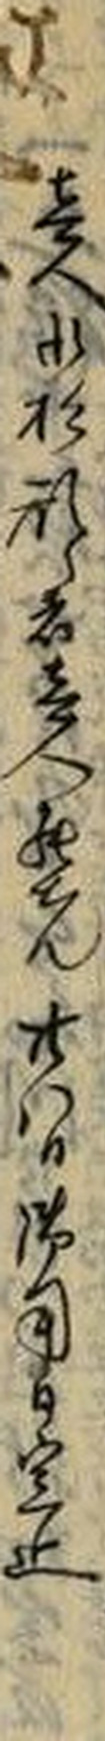壱人御杉形之者壱人罷出ル廿八日御用日定止
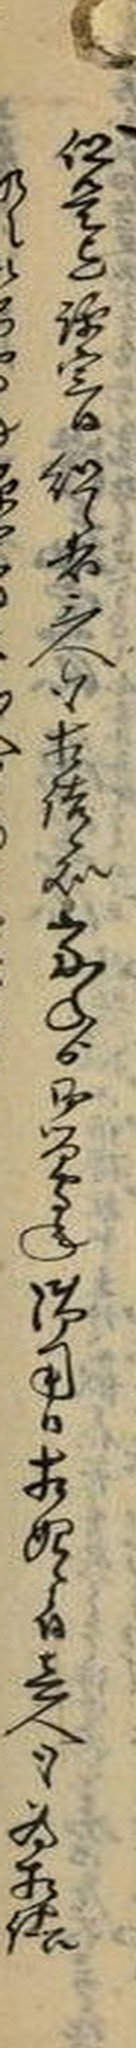但是迄評定日組之者三人ツヽ相詰候処当年ゟ御留守年御用日相始候に付壱人ツヽ為相詰
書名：御城下諸事之部
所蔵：福井県文書館 Fukui Prefectural Archives
